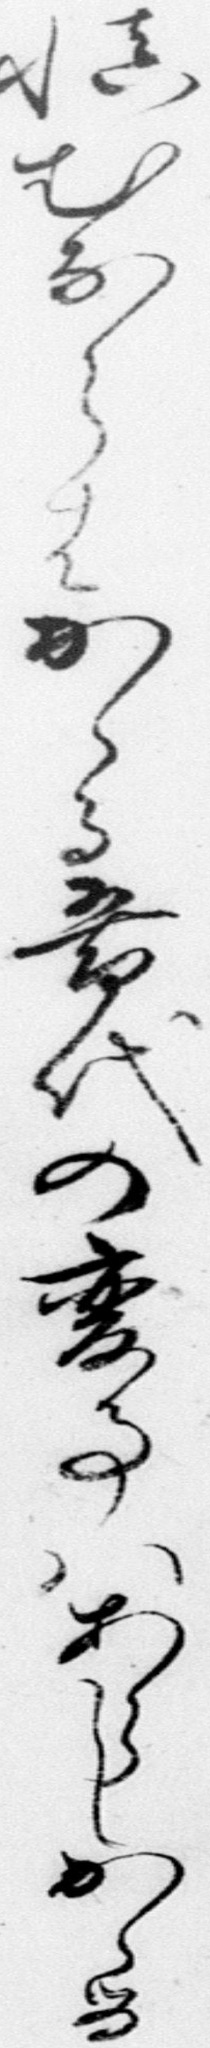慎むならはかゝる吾代の変事はあらしかゝる
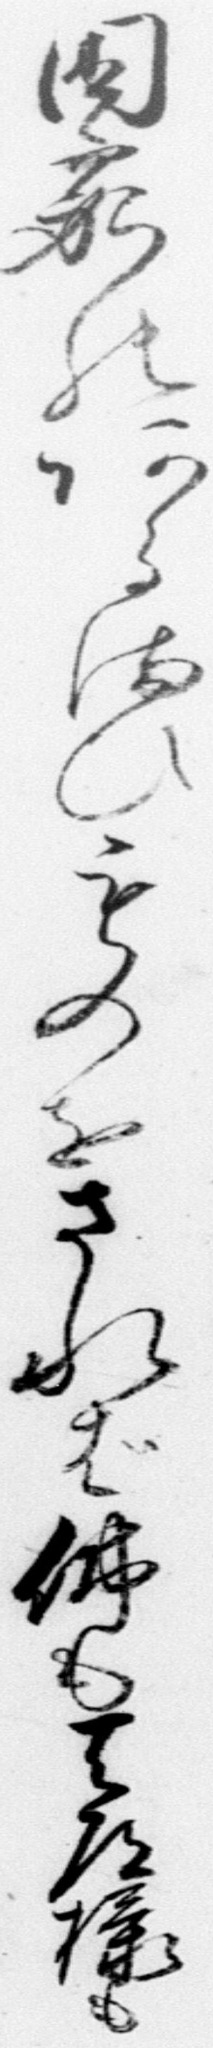困窮のあるまひものをされば仏も天道様も
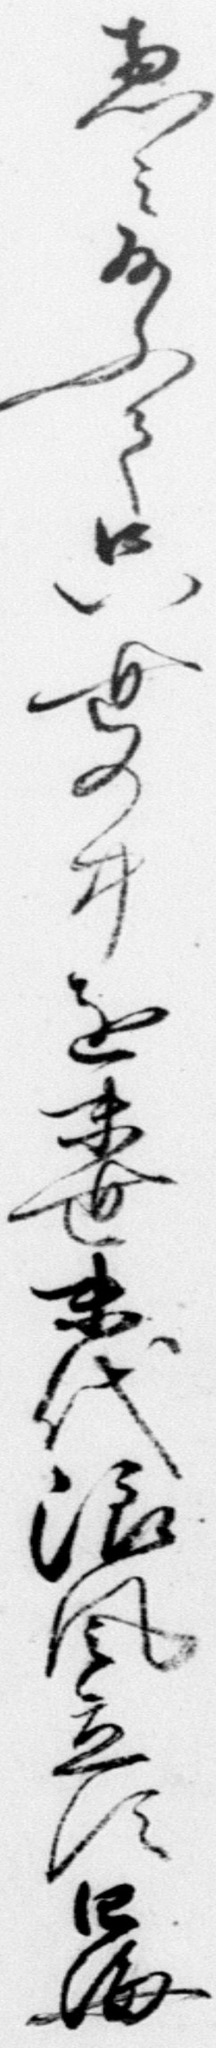恵み給ふて只世の中を末世末代浪風立す四海
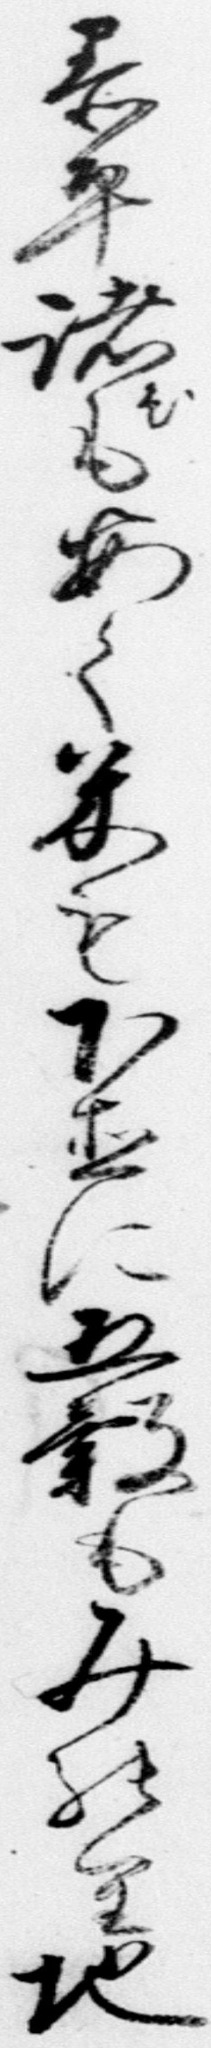泰平諸色も安く米も下直に五穀もみのり地
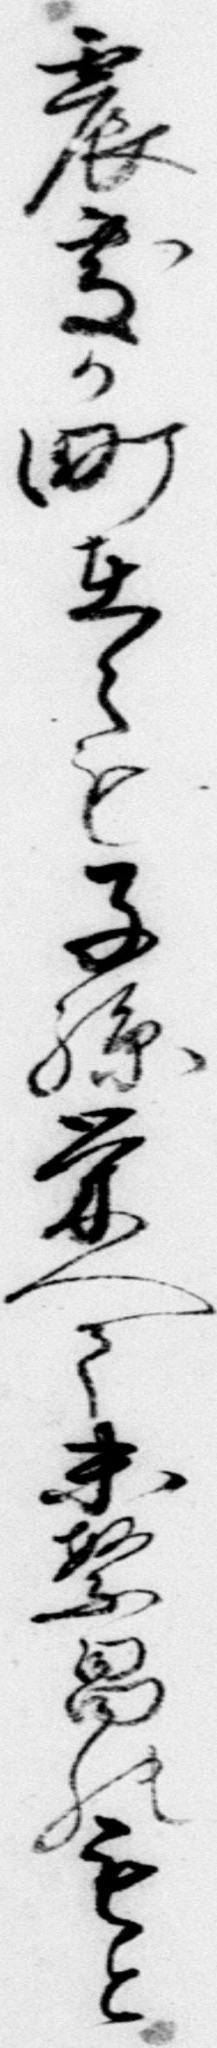震処か町在々も子孫栄へて末繁昌のもと
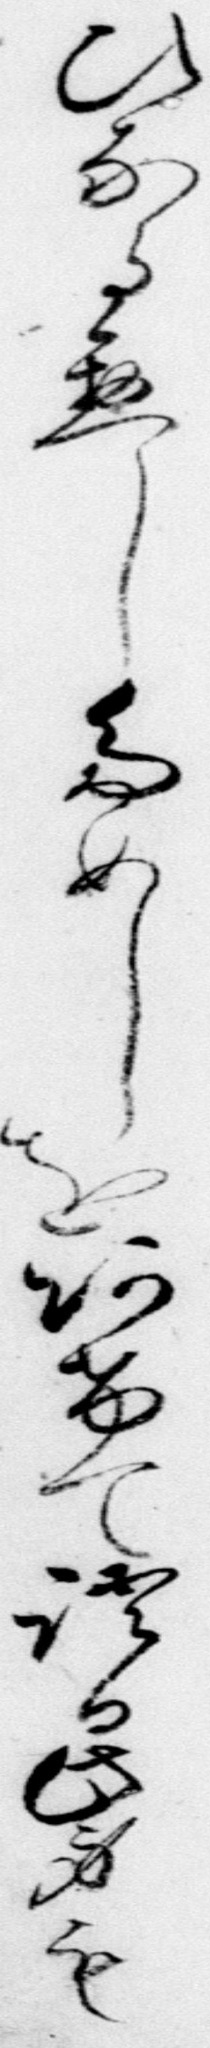ひなる惣しためしをあけて語る此身も

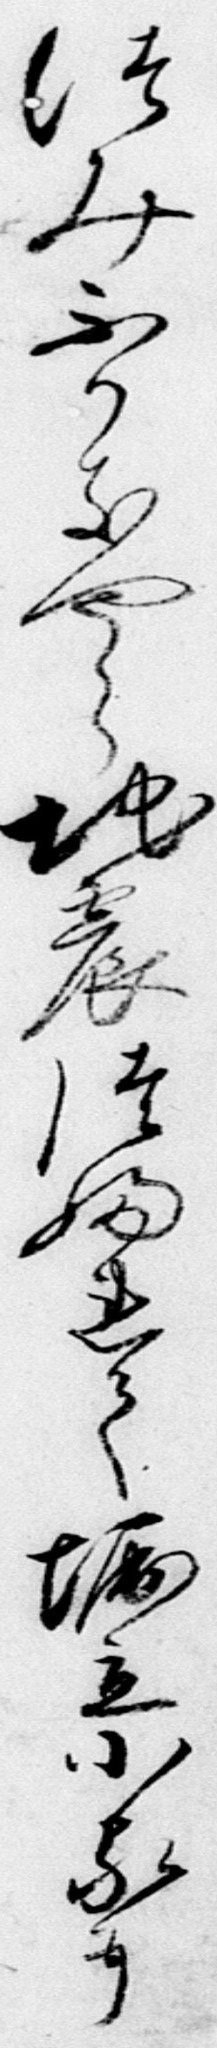つみふかきやう地震つふれて堀立小家に
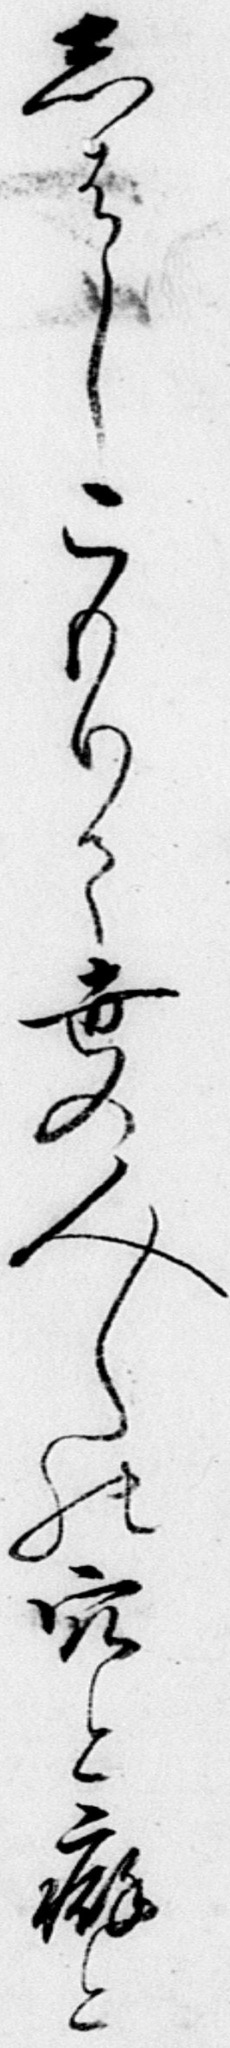しはしこもりて世の人々の穴と癖と
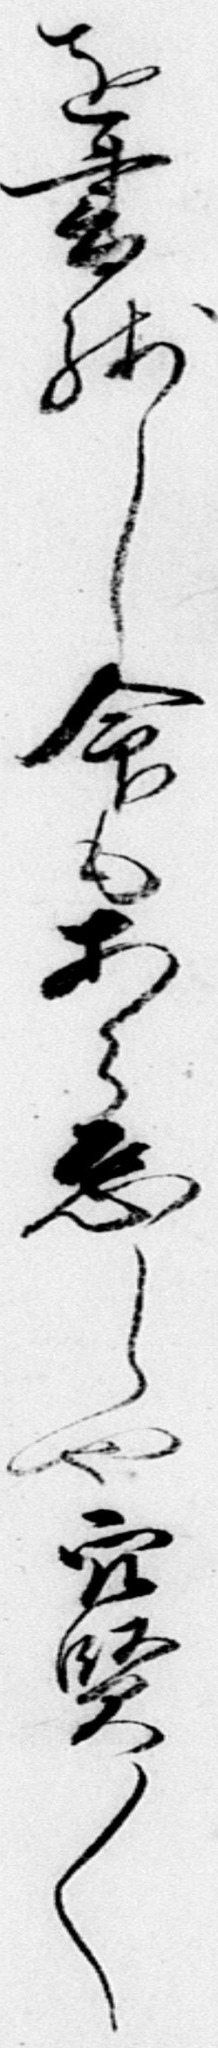を書残し命もあら恐しや穴賢〳〵
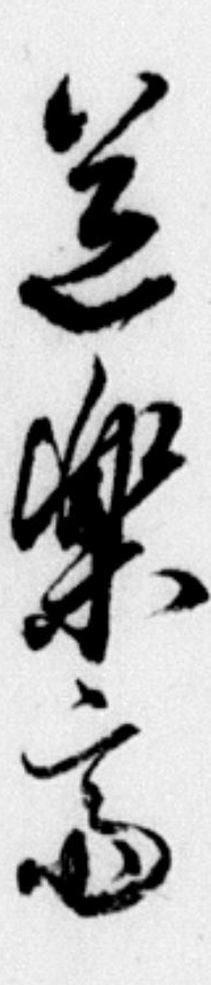道楽斎
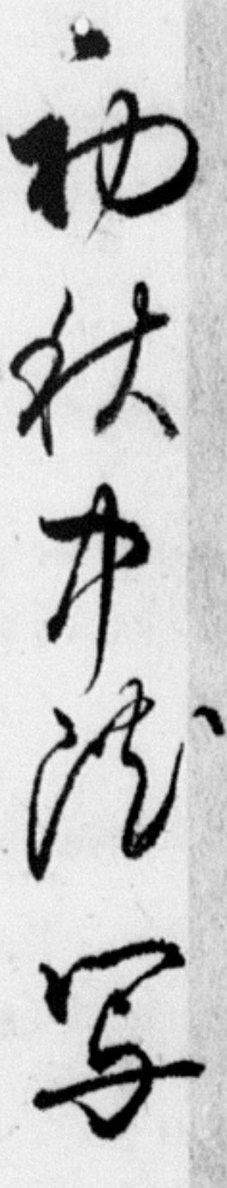初秋中院写
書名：越後地震由来
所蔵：徳島県立図書館
